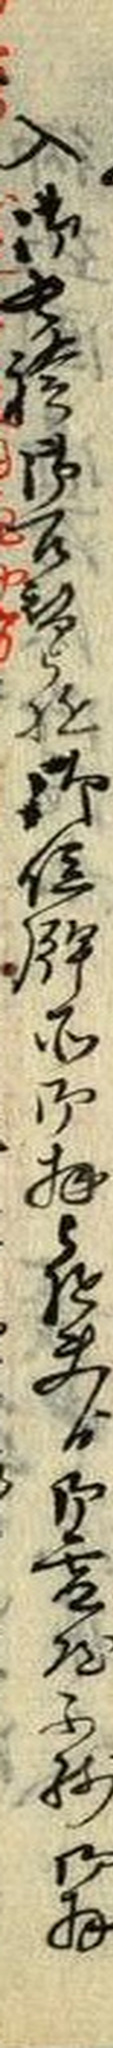入御長袴御召替被遊御位牌所御拝被遊夫ゟ御霊屋不残御拝
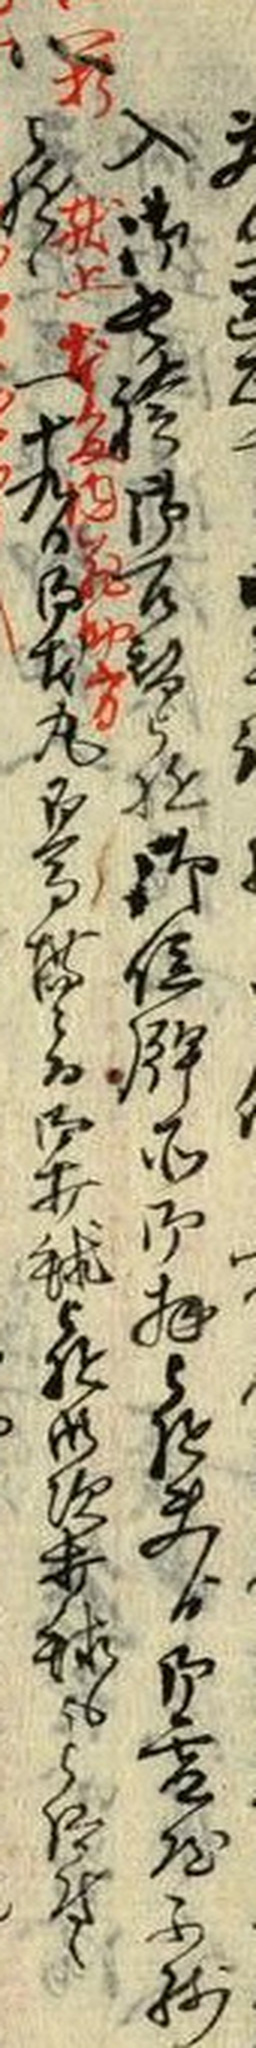被遊候一十九日御本丸御馬場ニ而御打毬被遊御次打毬も被仰付候
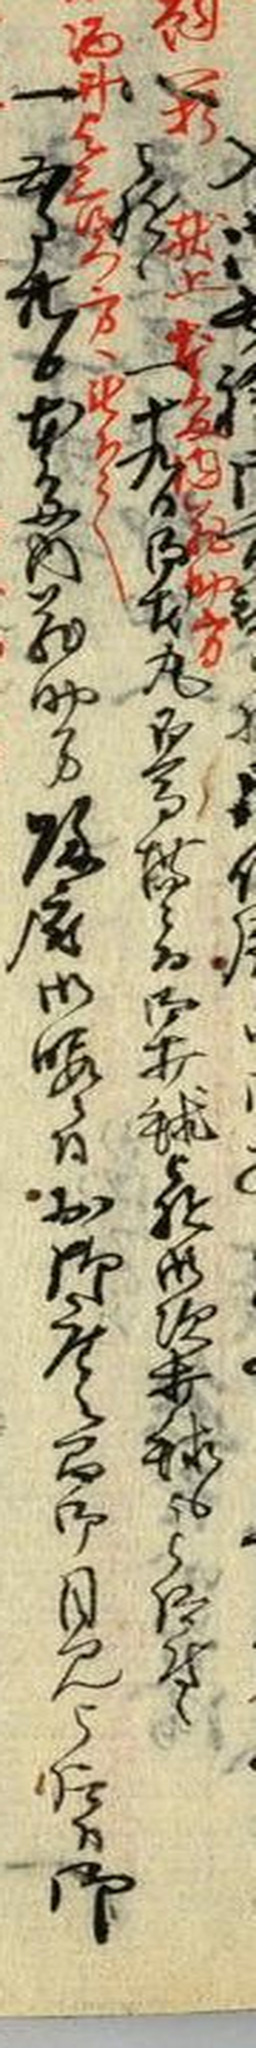一五月廿日本多内蔵助方帰府御暇ニ付於御座之間御目見被仰付御
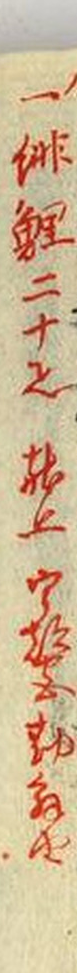一緋鯉二十疋献上宇都宮勘解由
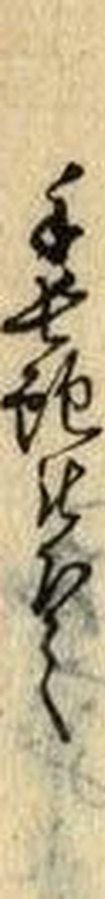手長鮑被下之
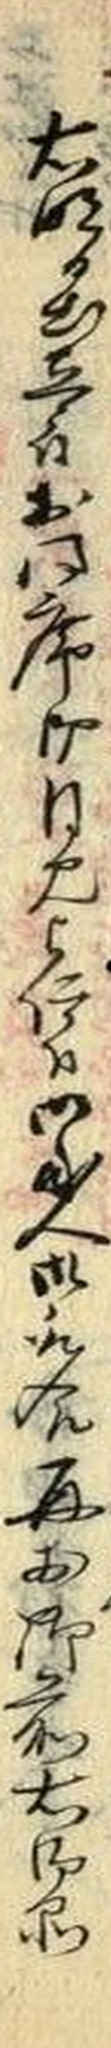右明日出立ニ付於同席御目見被仰付候御用人御取合再於御前右御品
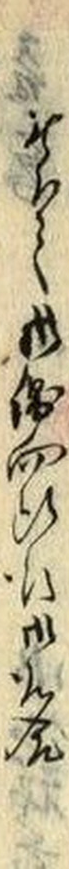被下御側向頭取御取合
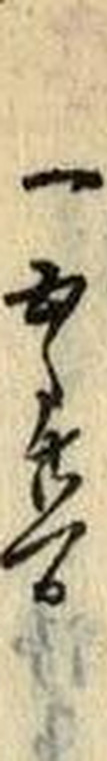一五月廿一日
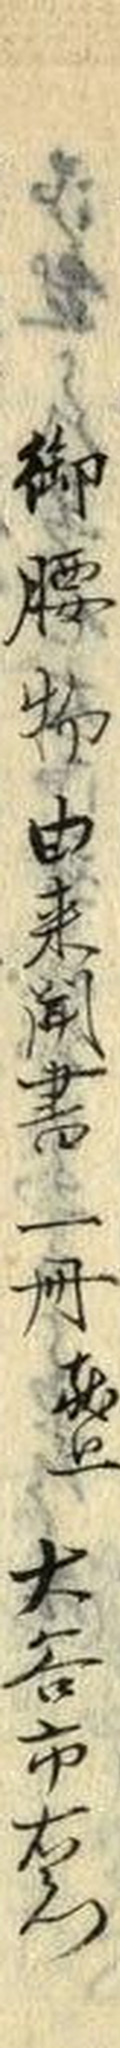御腰物由来聞書一冊献上大谷市右衛門
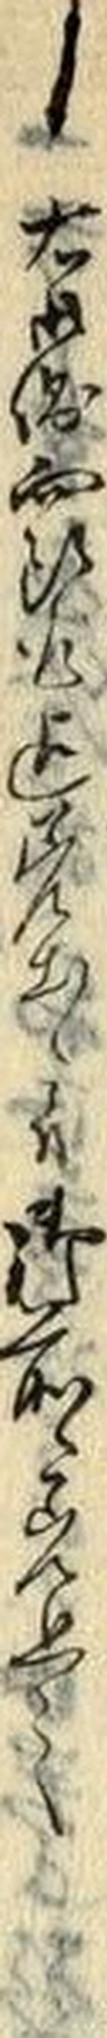右御側向頭迄差出候ニ付御前へ差上之
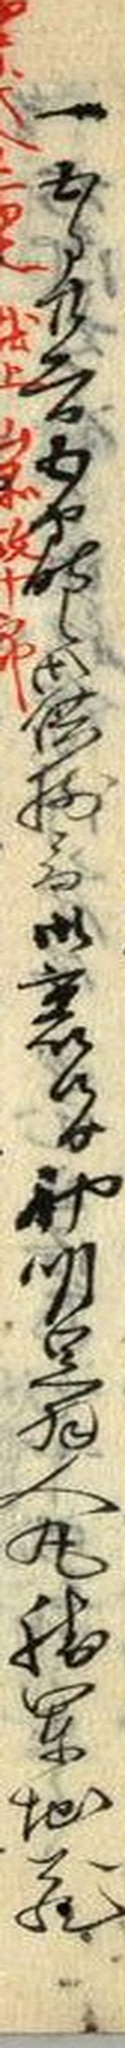一五月廿二日五半時之御供揃ニ而裏口ゟ神明足羽人丸勝軍地蔵
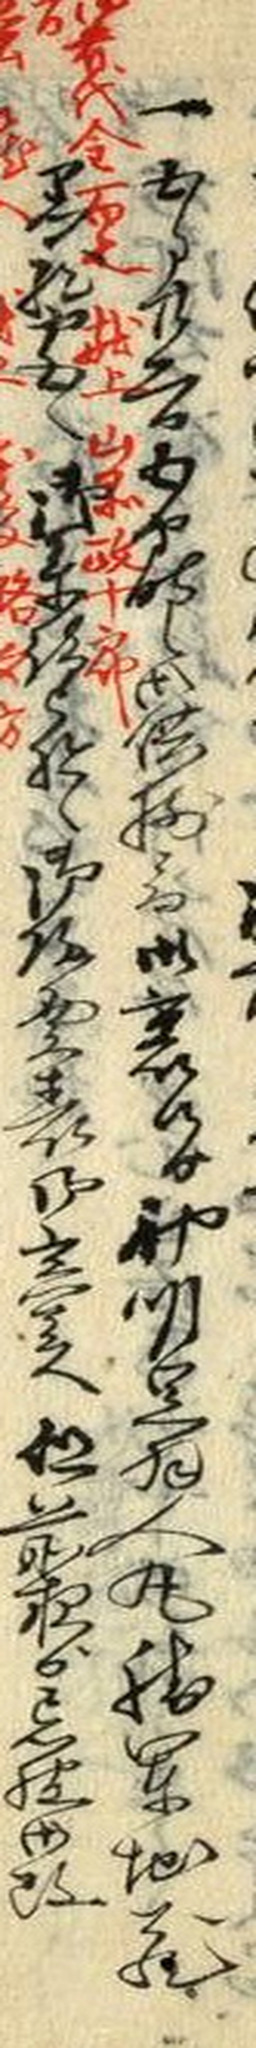黒龍宮へ御参詣被遊候御帰殿表御玄関但前夜ゟ忌服御改
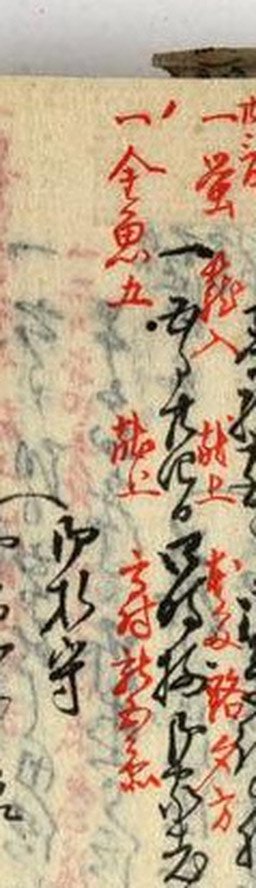一金魚五献上高村新五兵衛
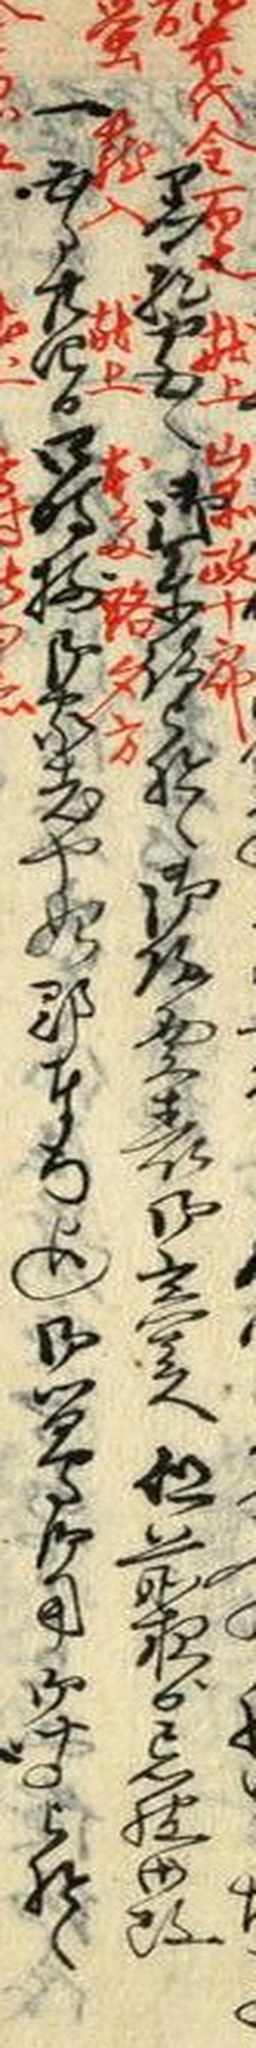一五月廿四日四時揃御家老中始郡奉行迄御留守御用御聞被遊候
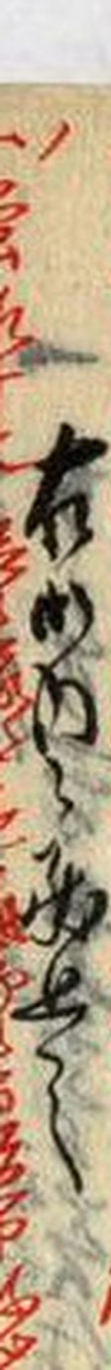右御内々献上之
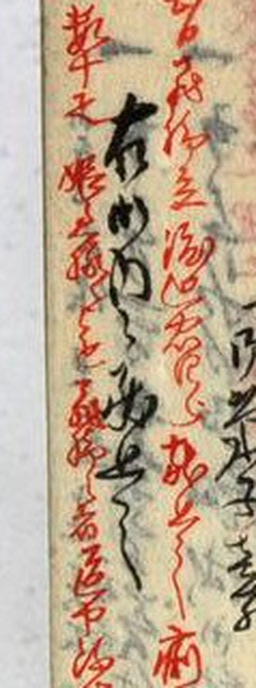右御内々献上之
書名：少傅日録抄（斉承付側向頭取日記、在国）
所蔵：福井県文書館 Fukui Prefectural Archives
